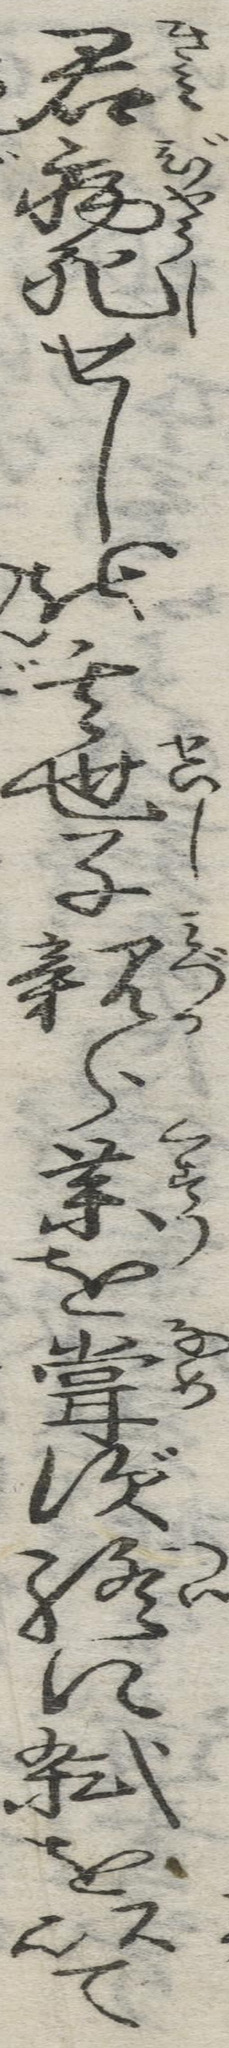君病死せしを其世子親ら薬を甞ず終に弑を以て
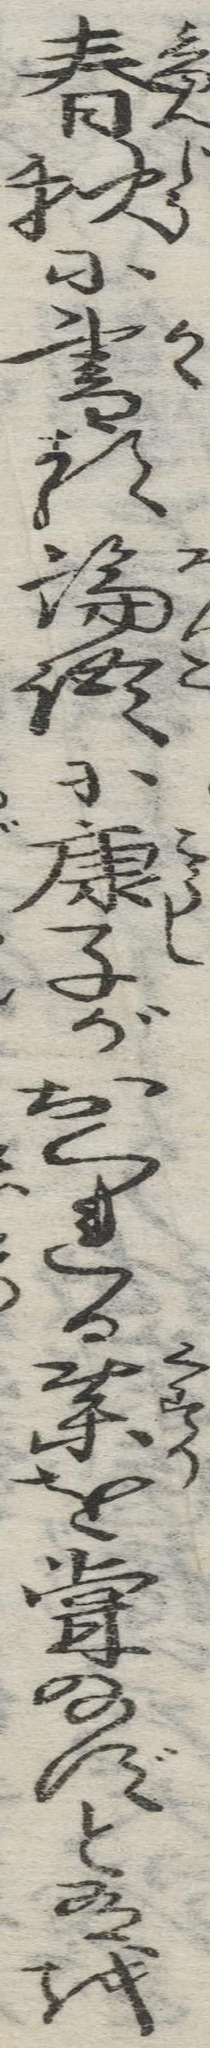春秋に書る論語に康子がおくれる薬を甞めずと有を
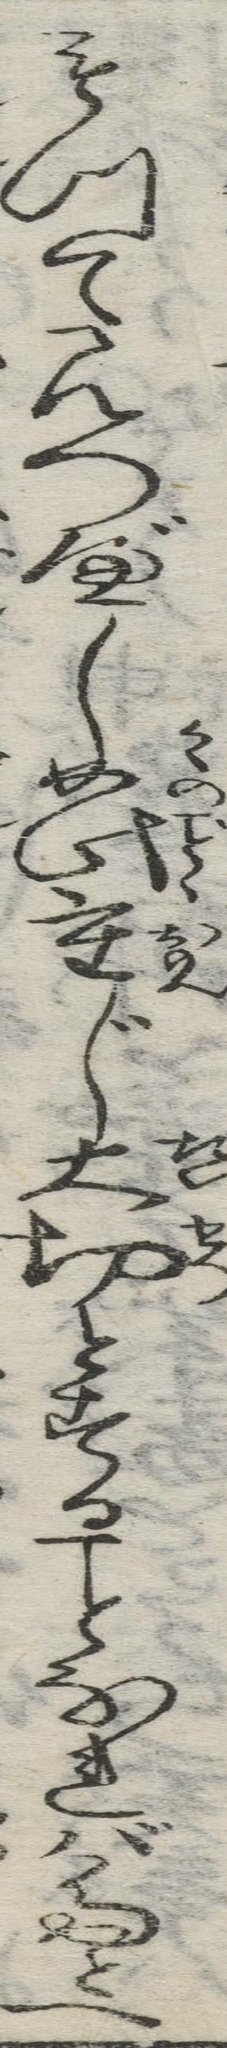もつて見つべし如此重じ大切とすることなればたとへ
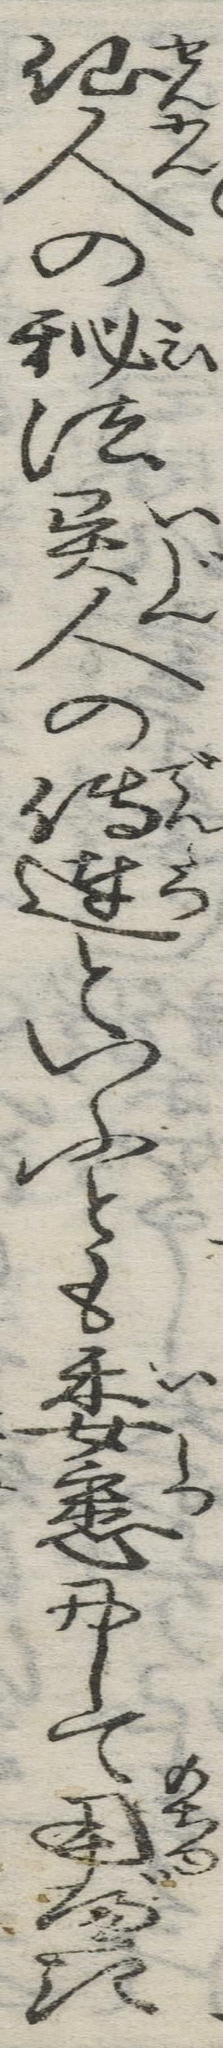仙人の秘法異人の伝達といふとも委悉にて用べき
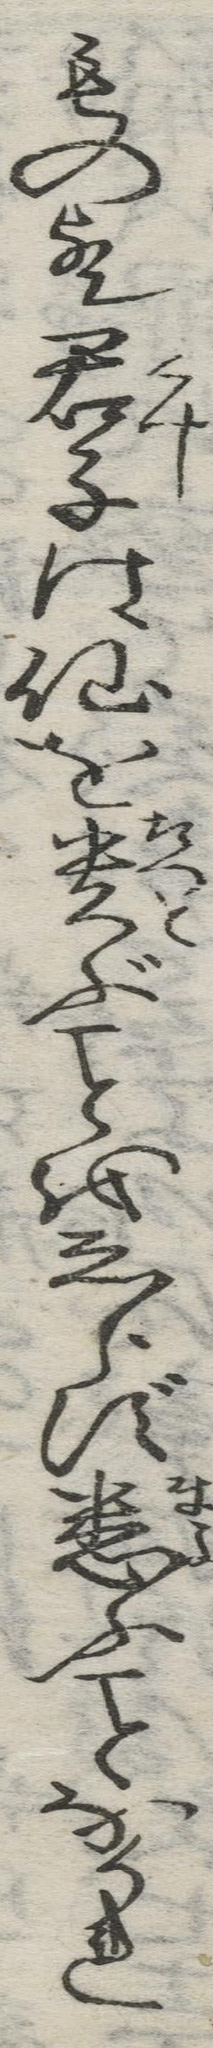もの有君子は仙を貴ぶことをしらず迷ふことなかれ
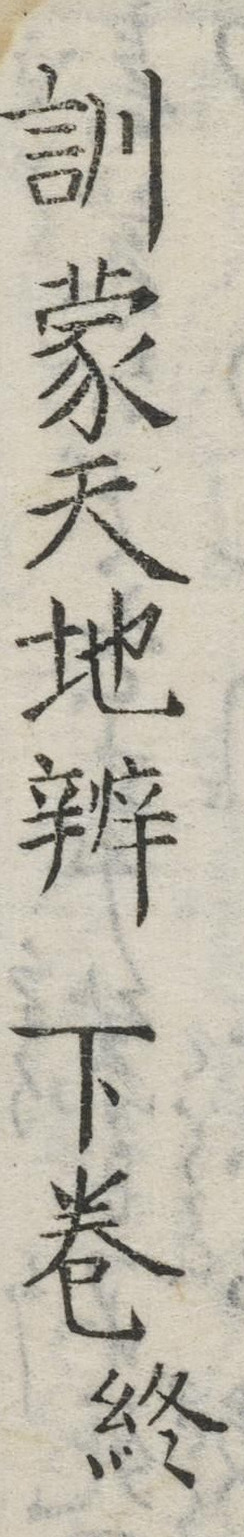訓蒙天地辨下巻終尾
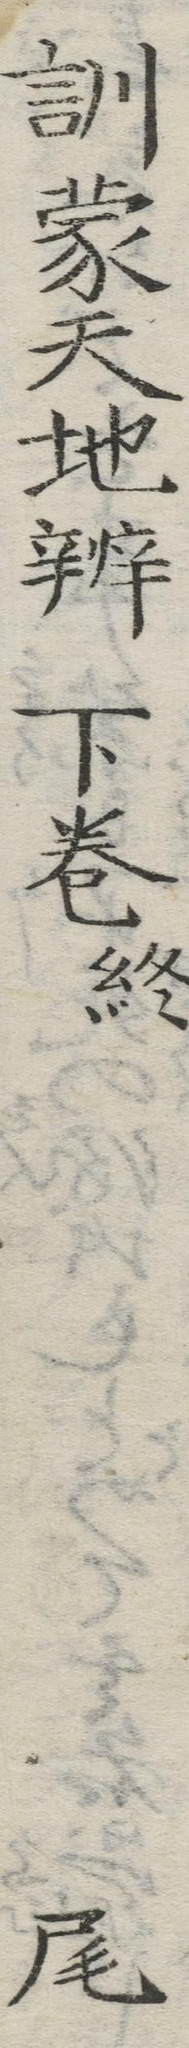訓蒙天地辨下巻終尾
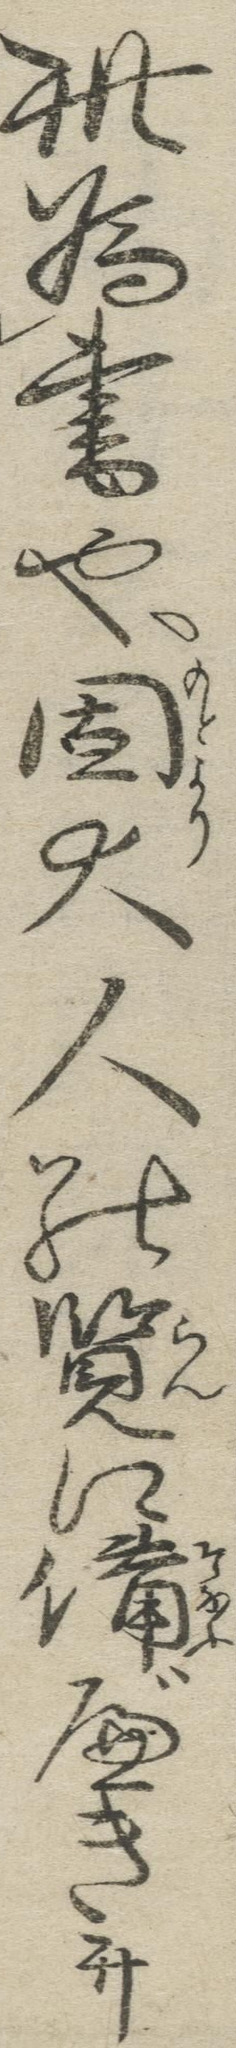此為書や、固大人の覧に備べきに
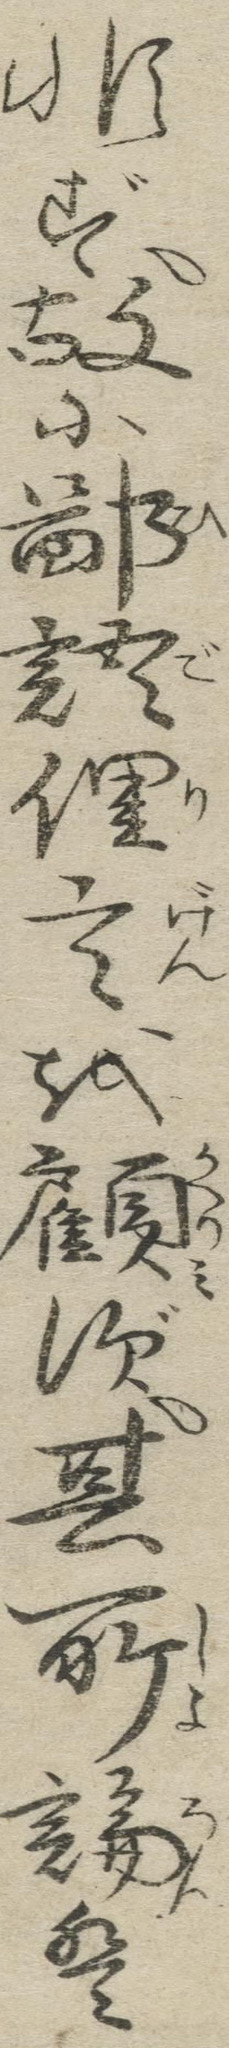非ず、故に鄙語俚言を顧ず、其所論は
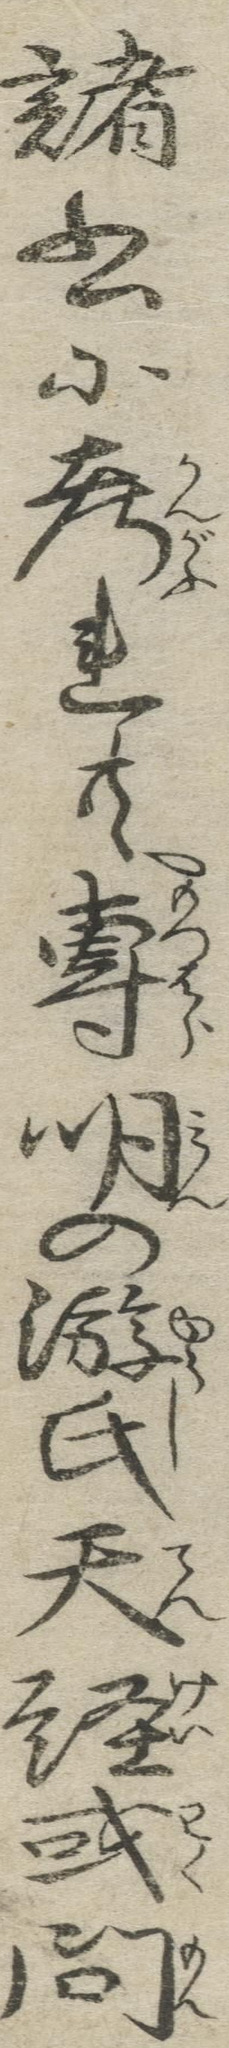諸書に考れ共、専明の游氏天経惑問
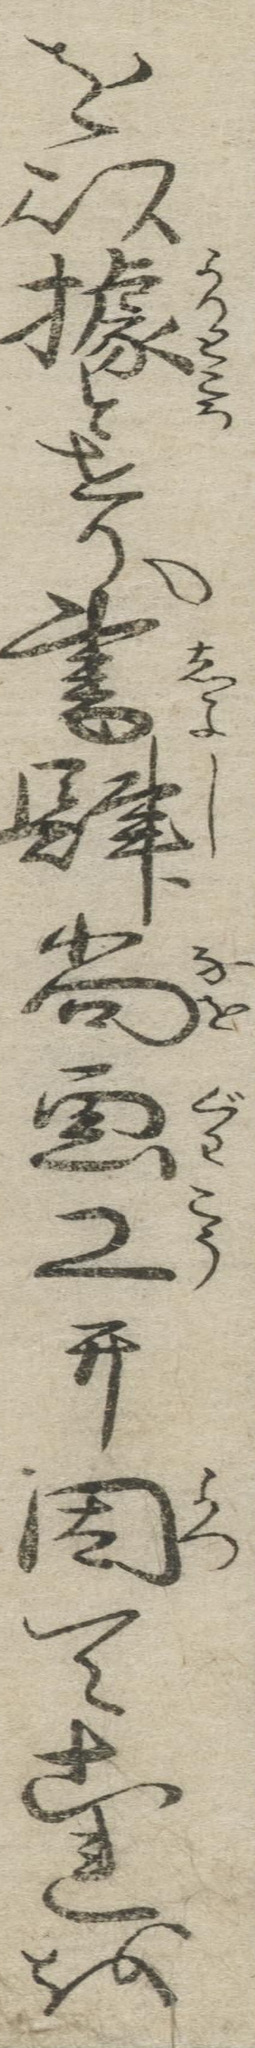を以拠とせり、書肆尚画工に因てこれを
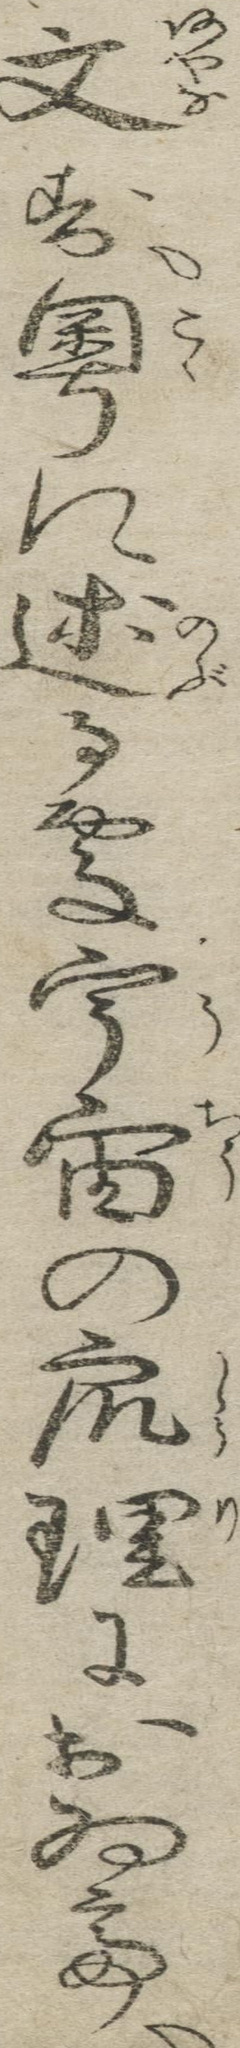文す、粤に述る処宇宙の衆理におゐて、
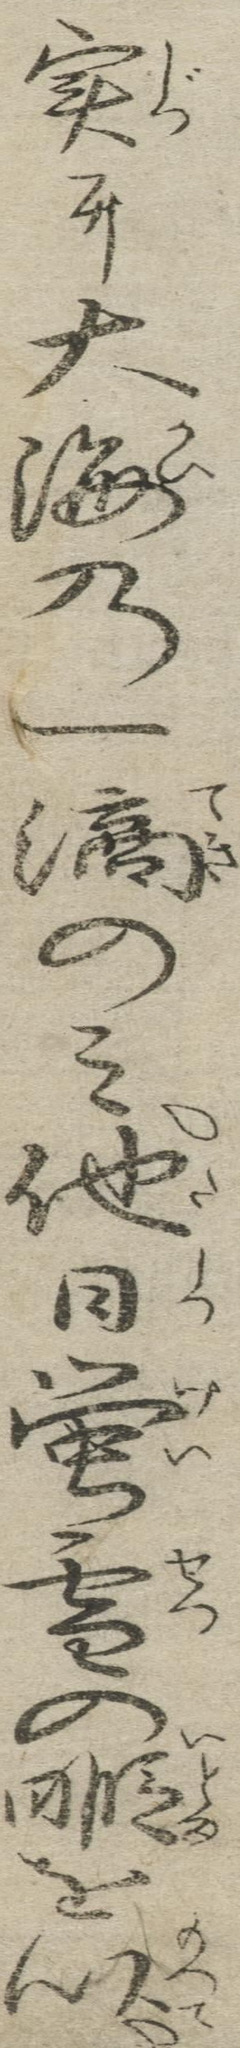実に大海の一滴のみ、他日蛍雪の暇を以、
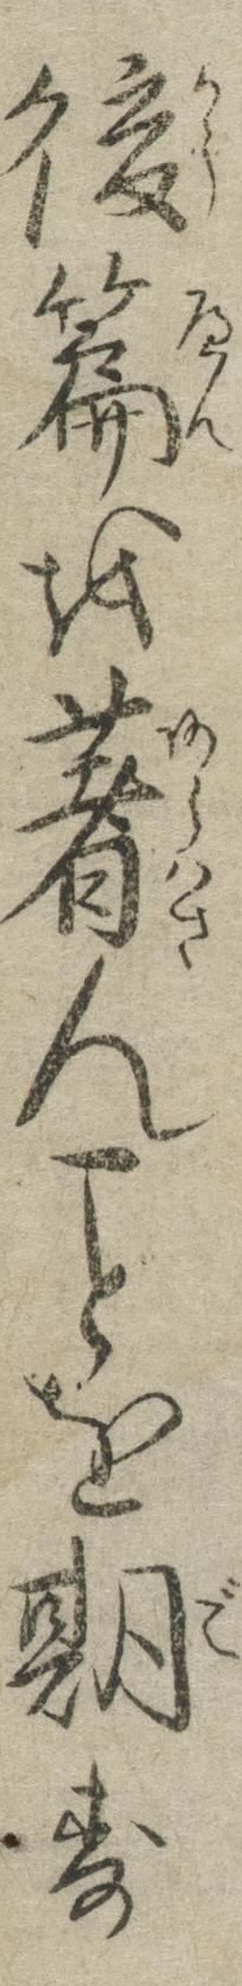後篇を著んことを期す

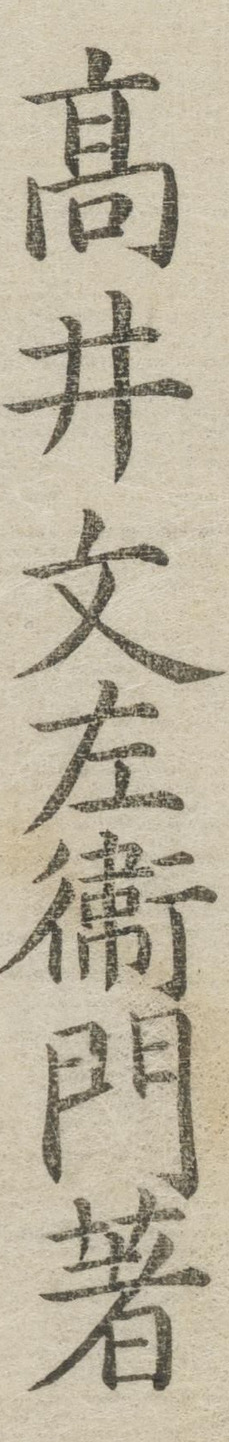髙井文左衛門著
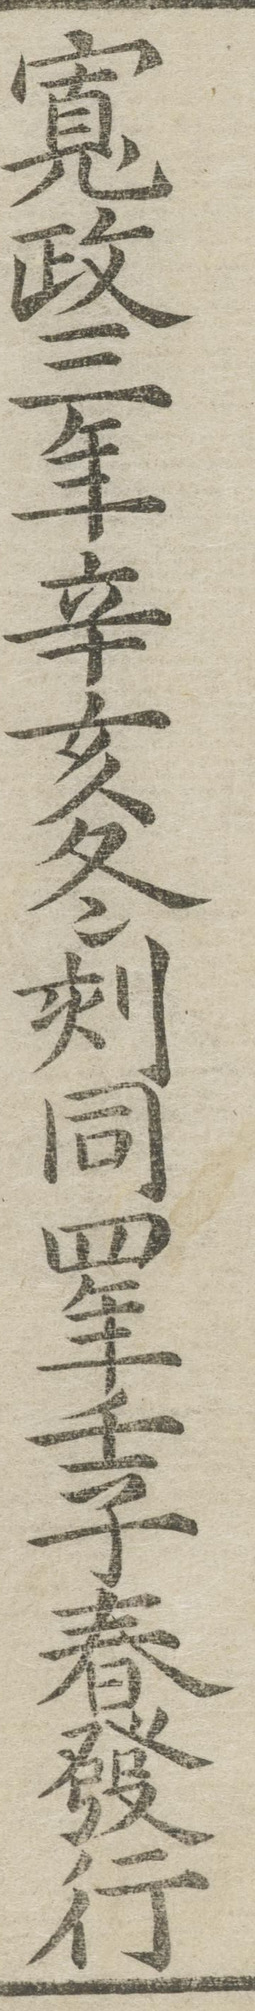寛政三年辛亥冬刾同四年壬子春発行
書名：訓蒙天地辨　人
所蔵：東京大学地震研究所図書室 Earthquake Research Institute Library, The University of Tokyo, JAPAN
